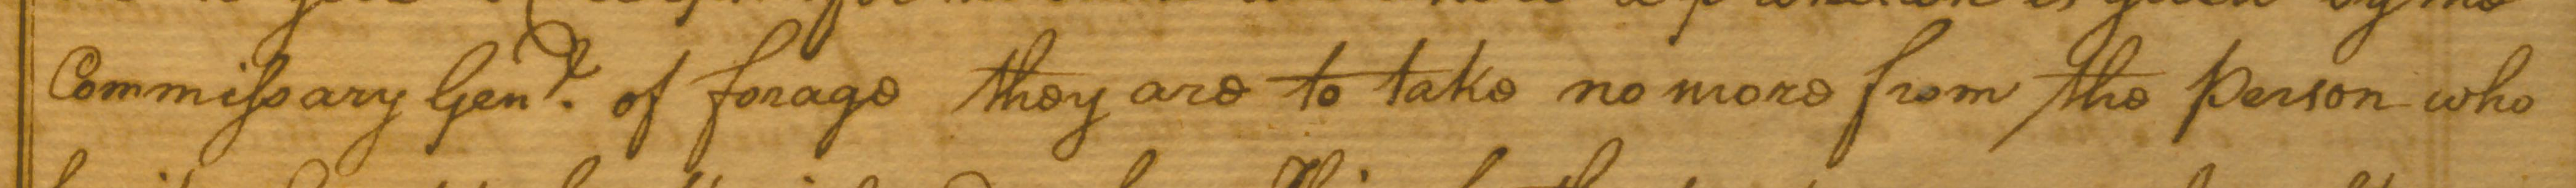Commissary Gen^l. of forage they are to take no more from the person who
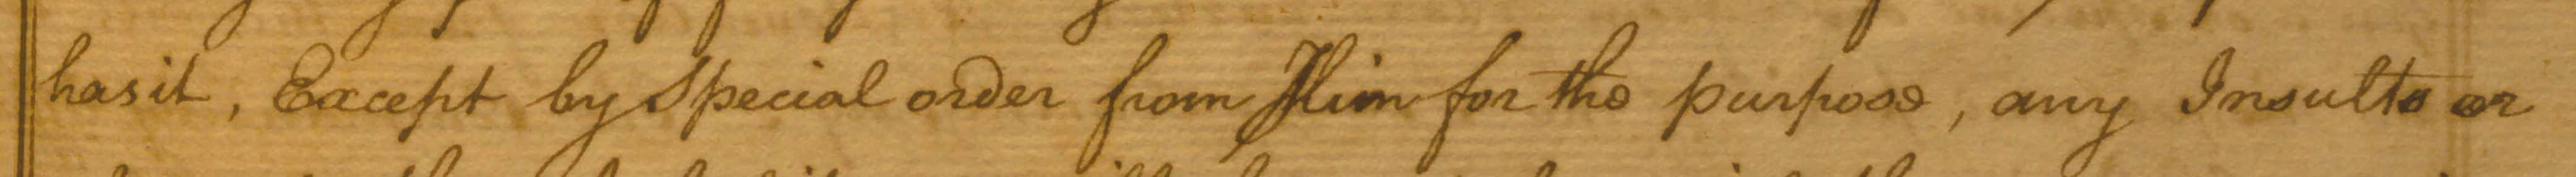has it, Except by Special order from Him for the purpose, any Insults or
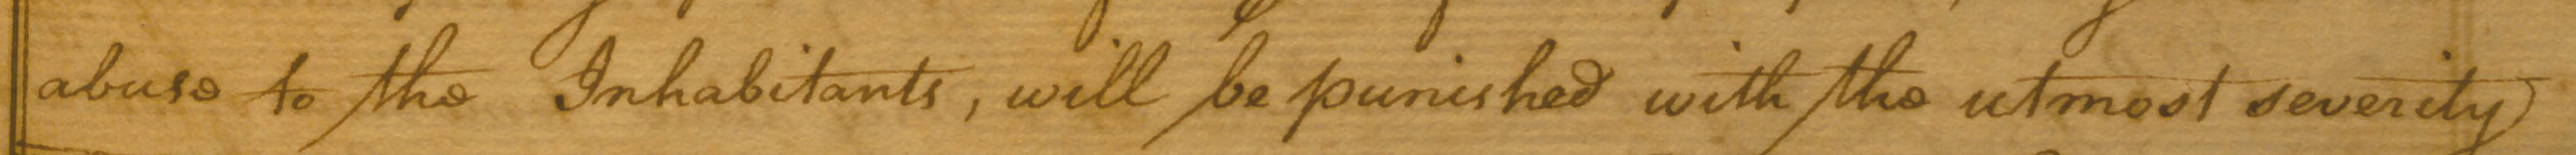abuse to the Inhabitants, will be punished with the utmost severity
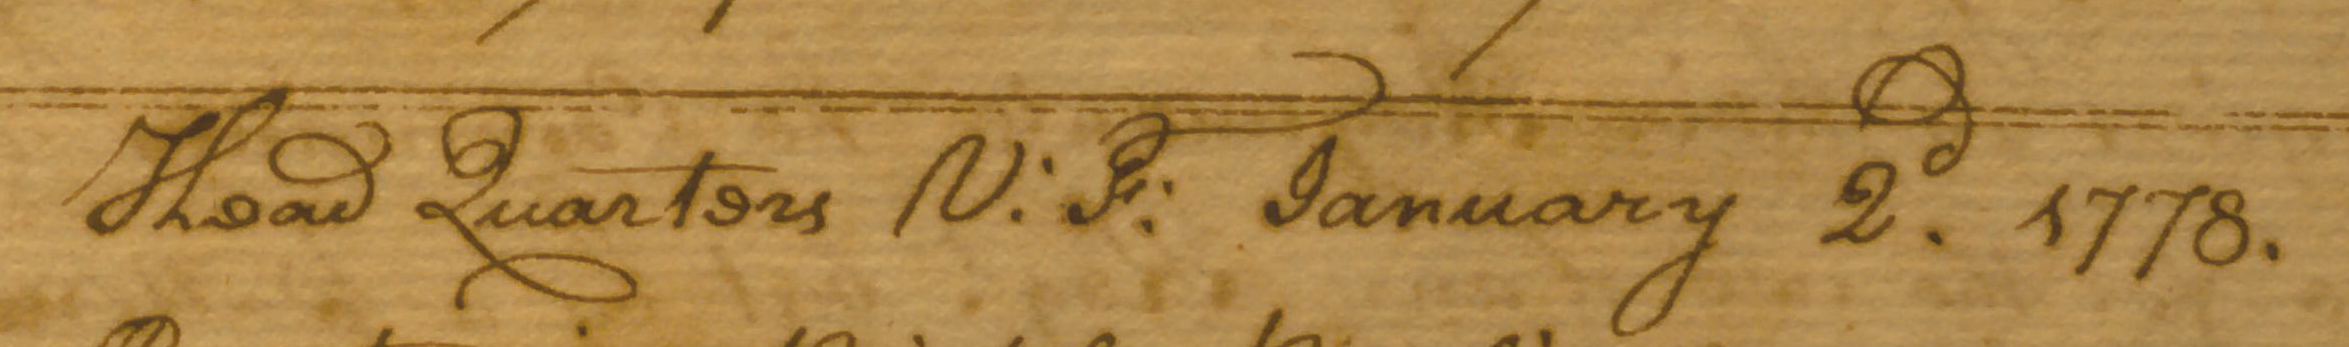Head Quarters V: F: January 2^d. 1778.
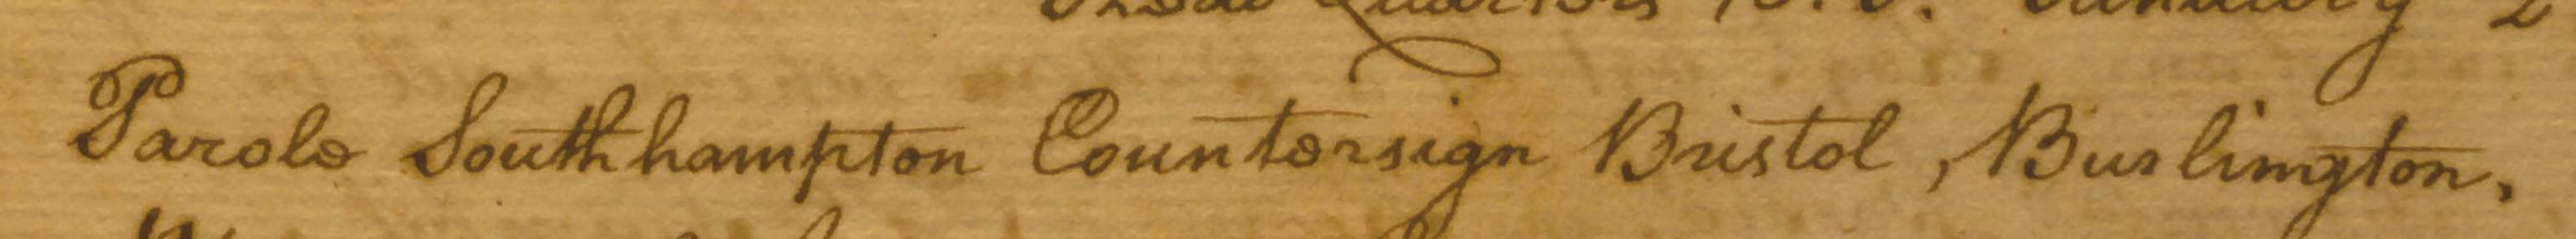Parole Southhampton Countersign Bristol, Burlington.
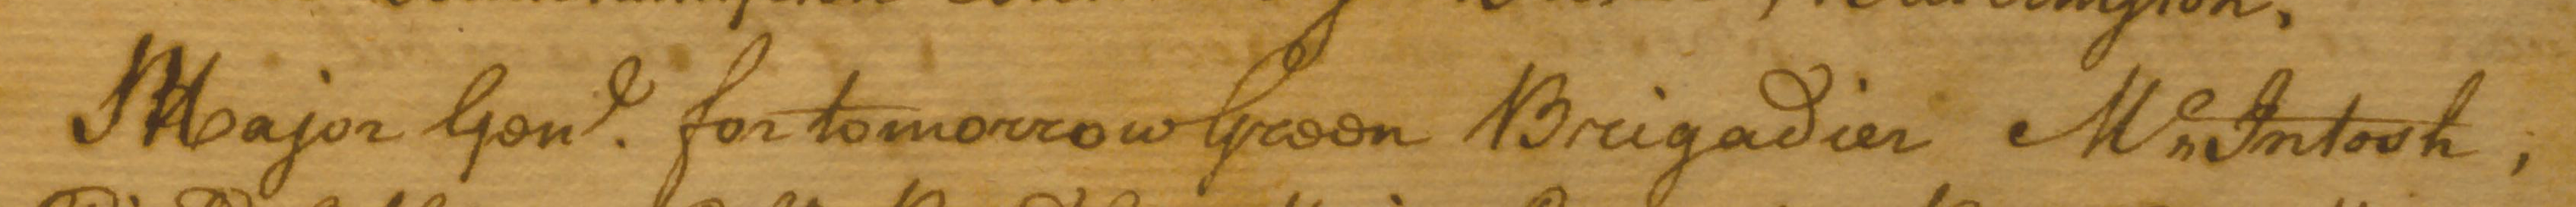Major Gen^l. for tomorrow Green Brigadier M^c.Intosh,
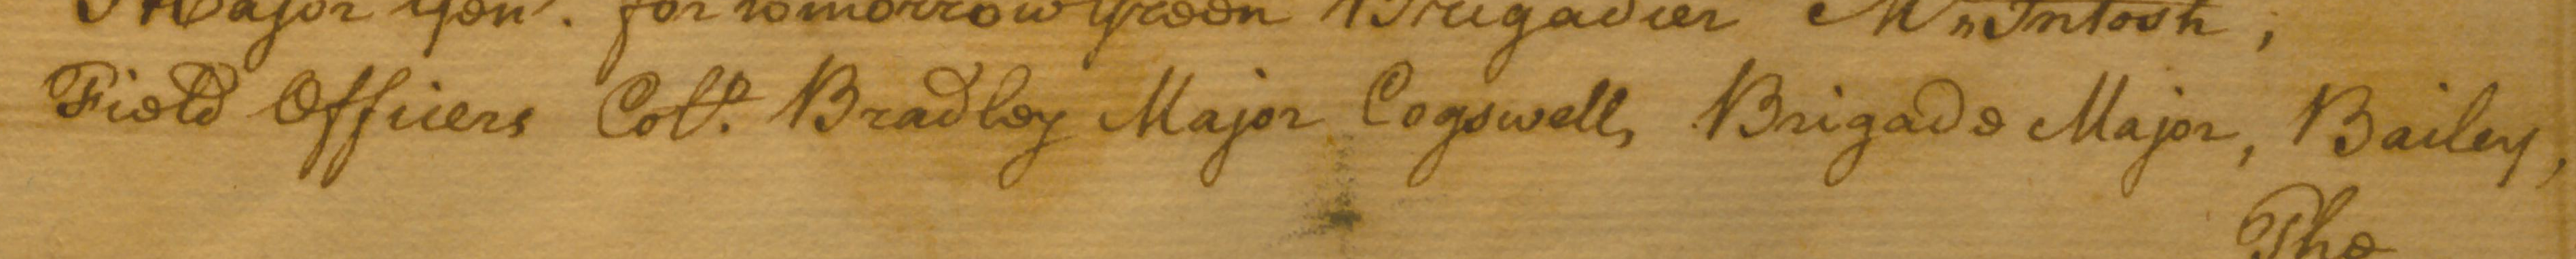Field Officers Col^o. Bradley Major Cogswell, Brigade Major, Bailey,
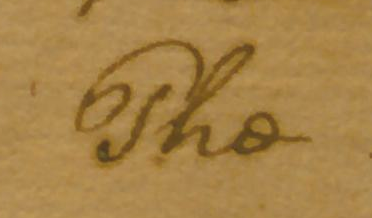The
